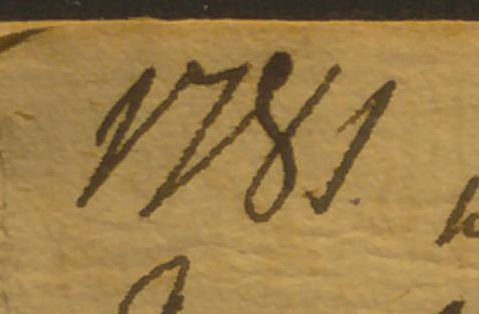1781
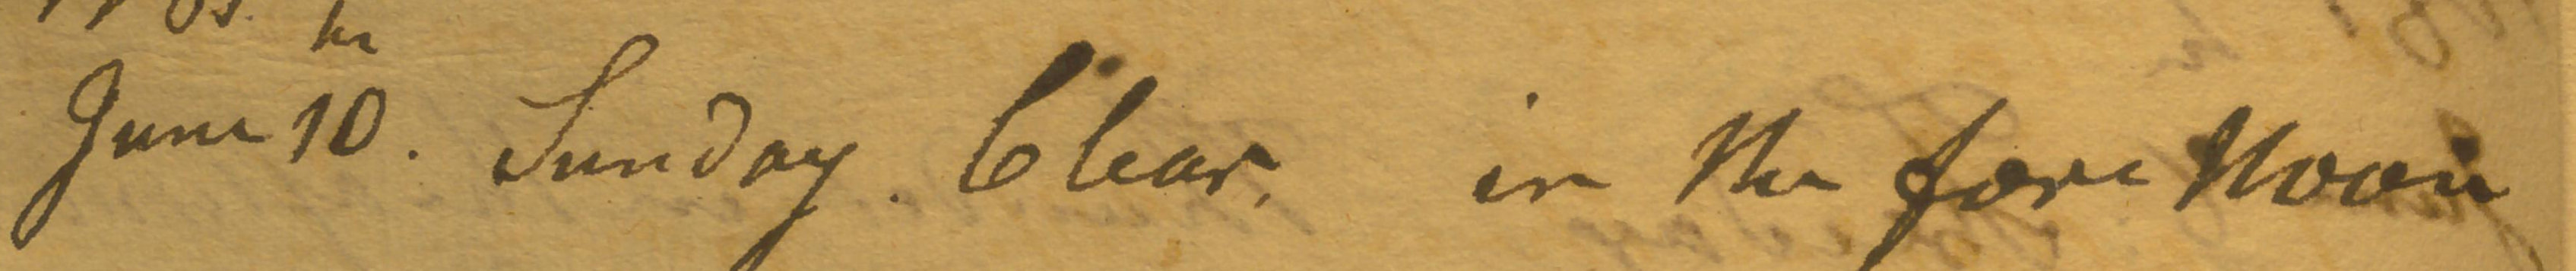June 10^th. Sunday Clear. in the fore noon
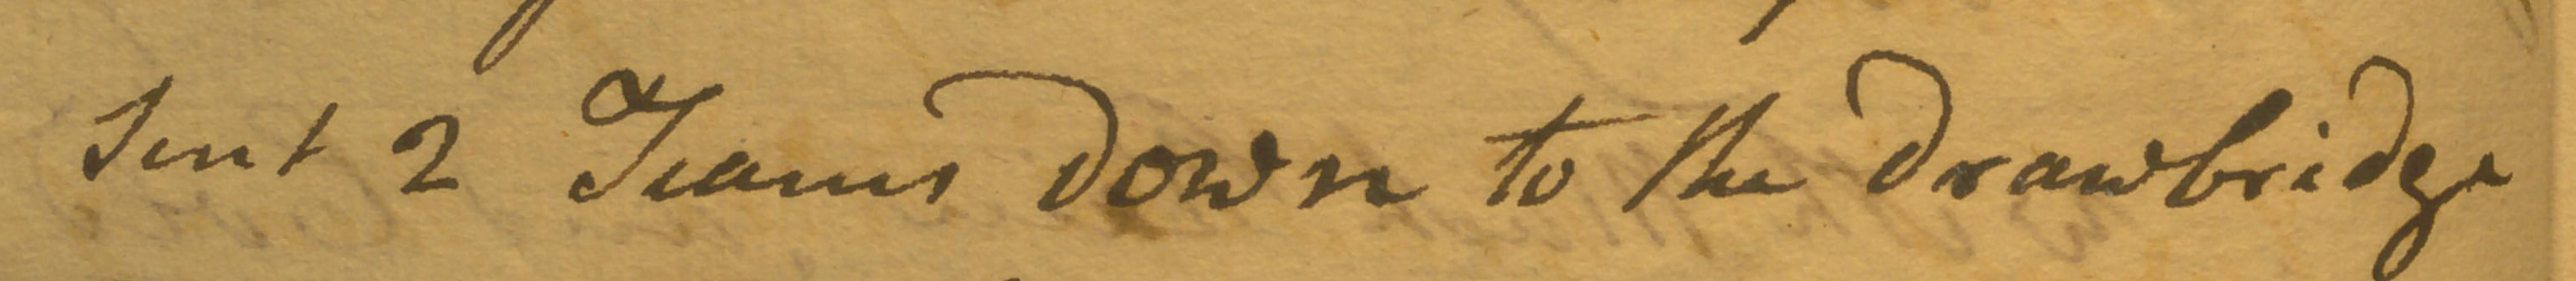Sent 2 Teams down to the drawbridge
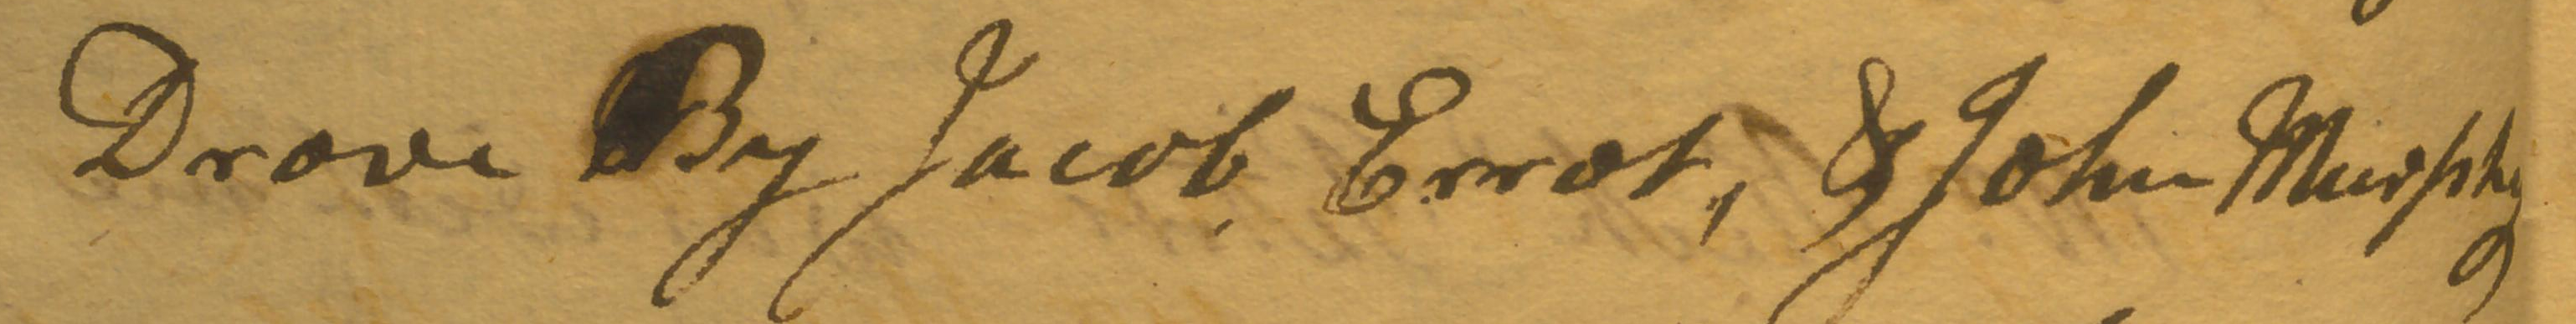Drove By Jacob Errot, & John Murph
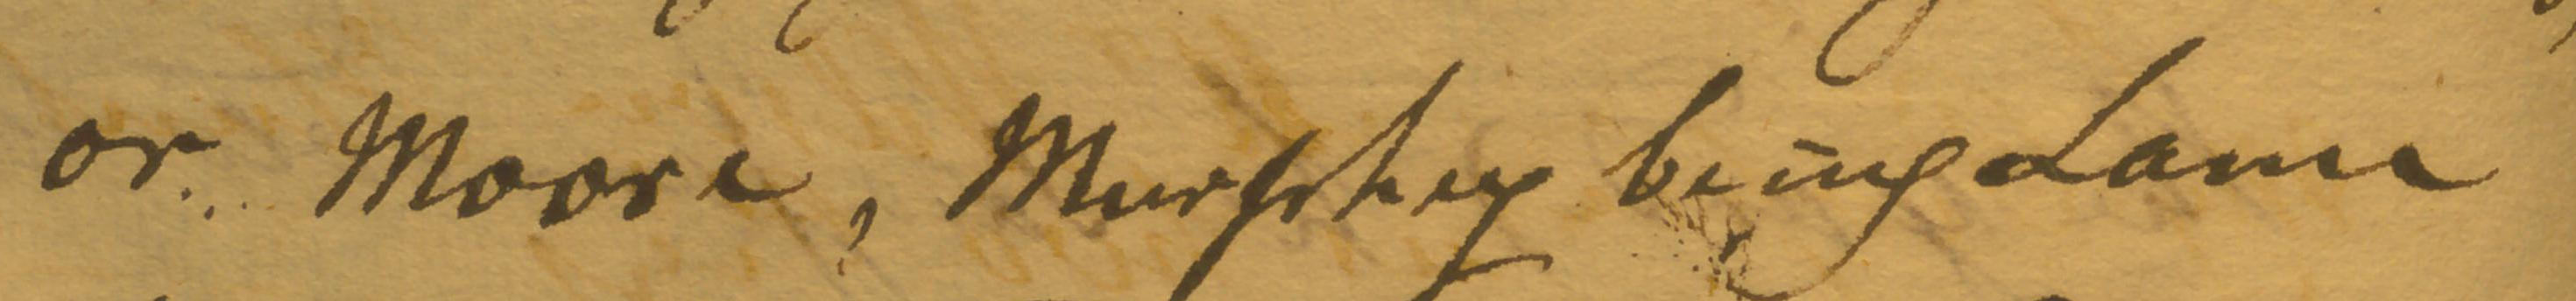or Moore, Murphey being Lame
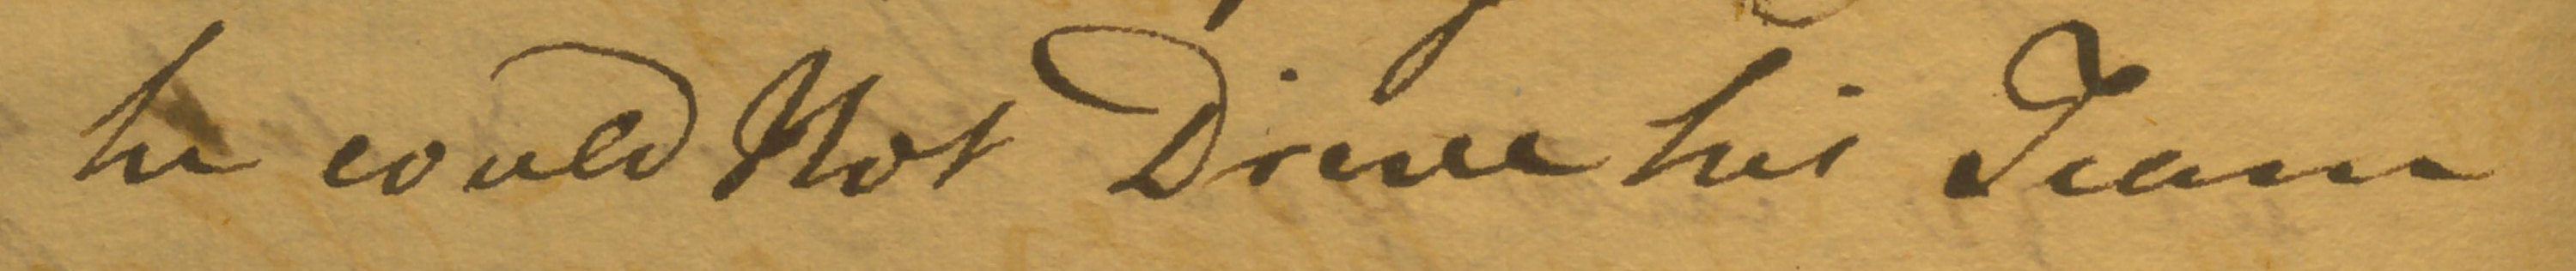he could Not Drive his Team
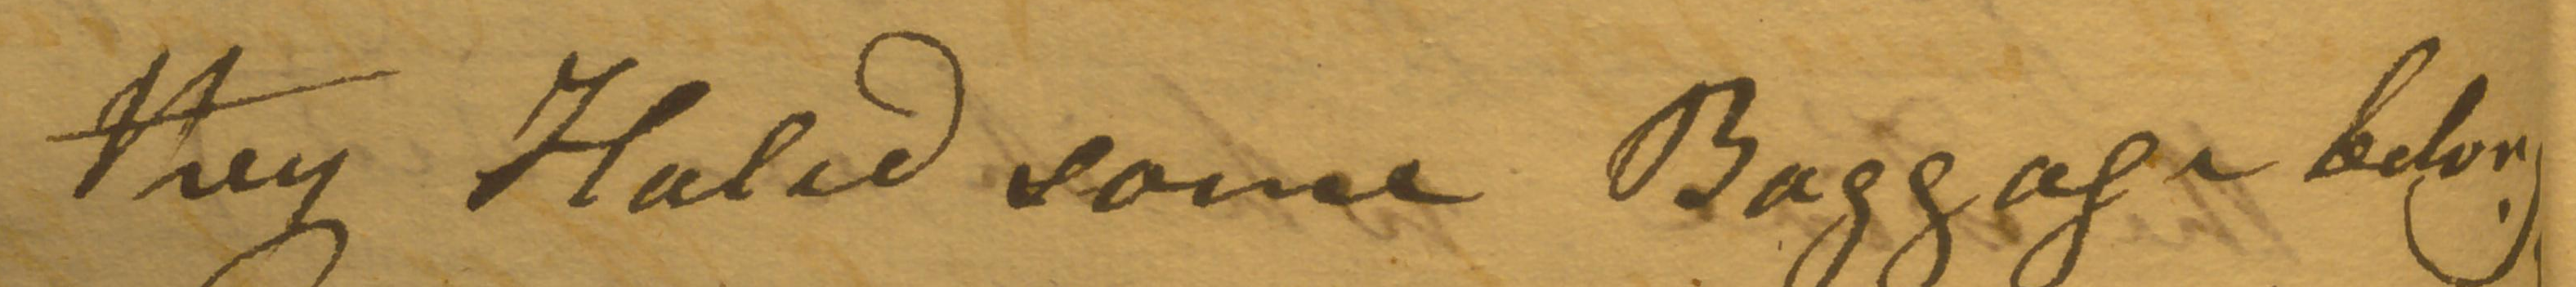they Haled some Baggage belong
